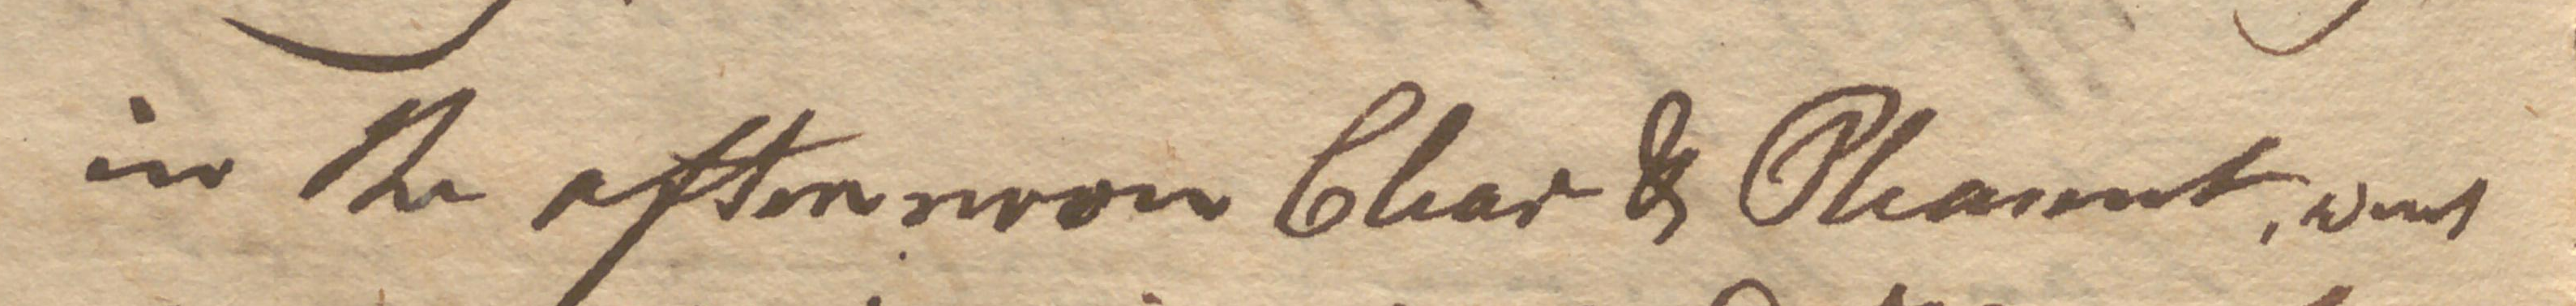in the aftennoon Clear & Pleasent went
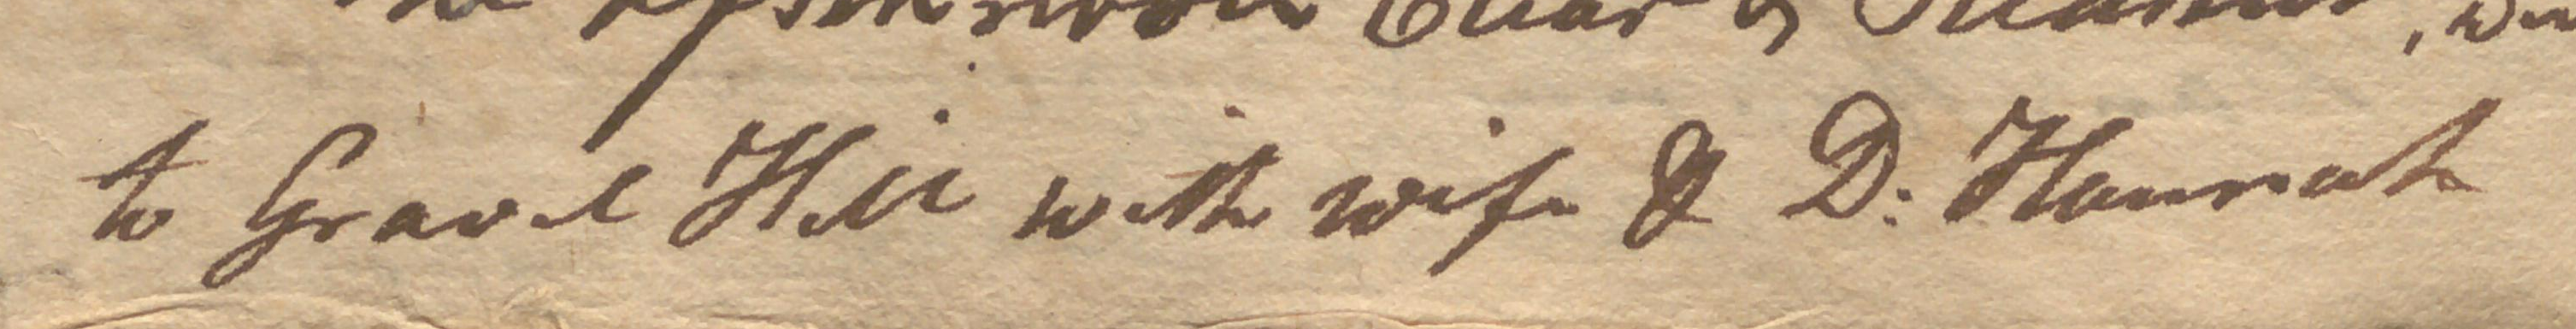to Gravel Hill with wife & D. Hannah
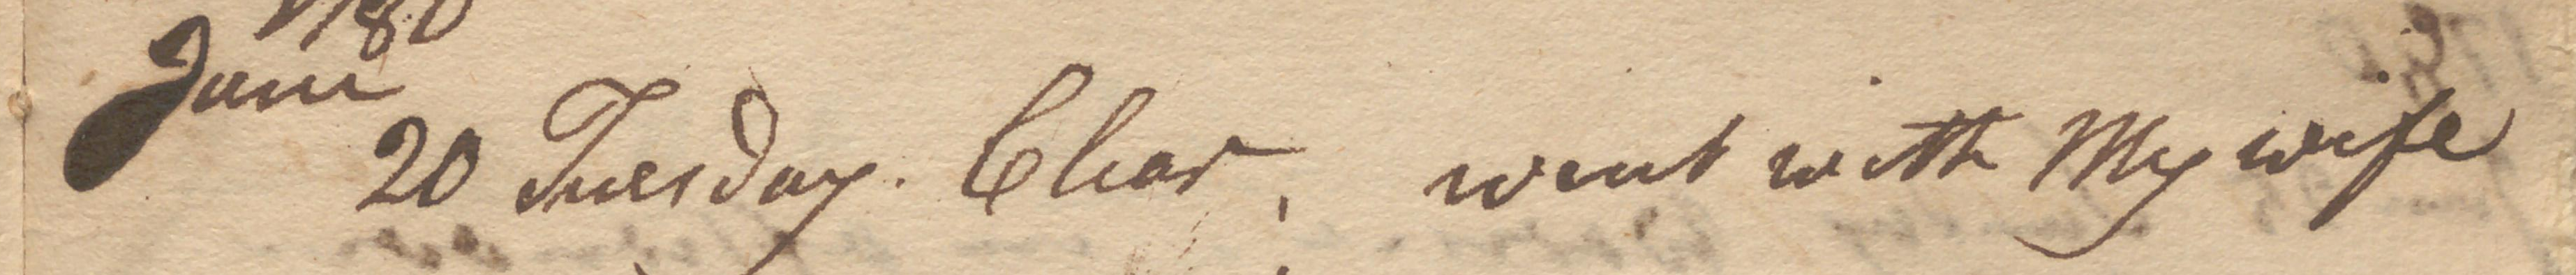9 20 Tuesday. Clear went with My wife
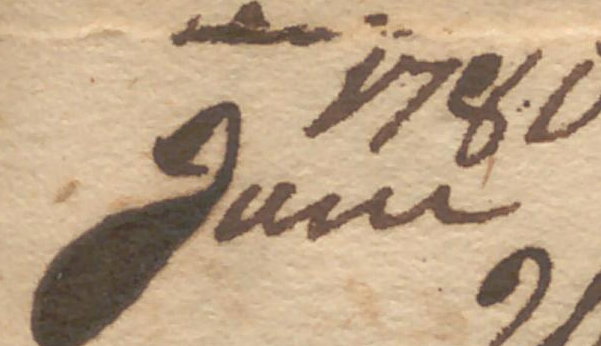Jume
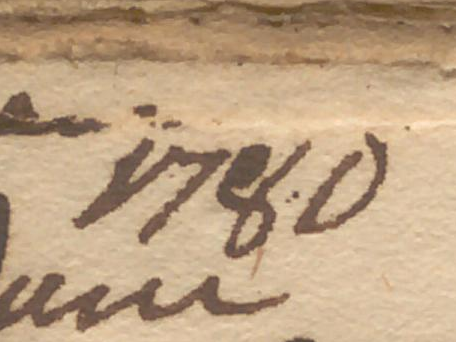1780
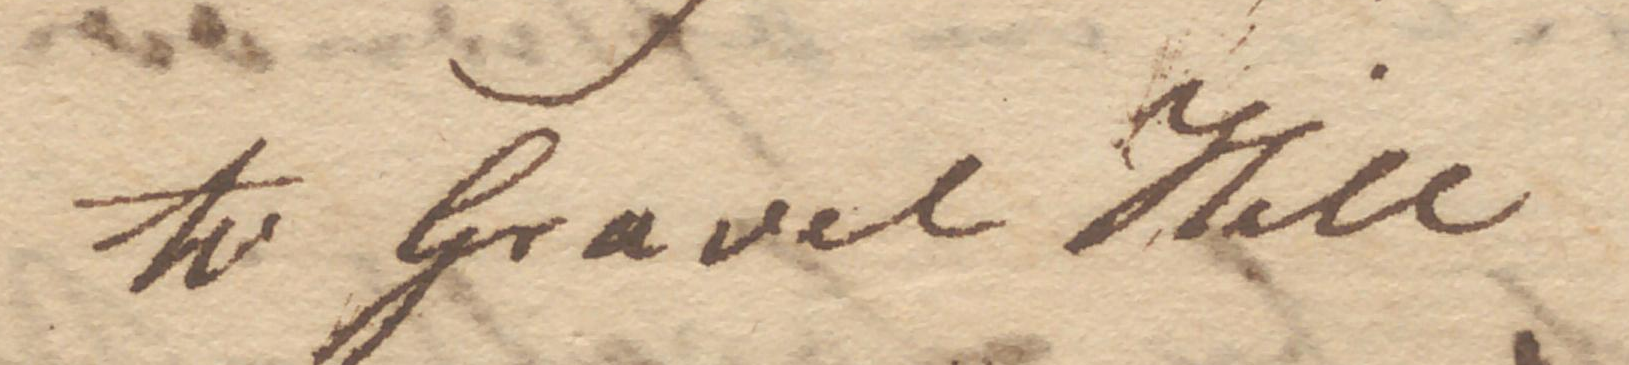to Gravel Hill
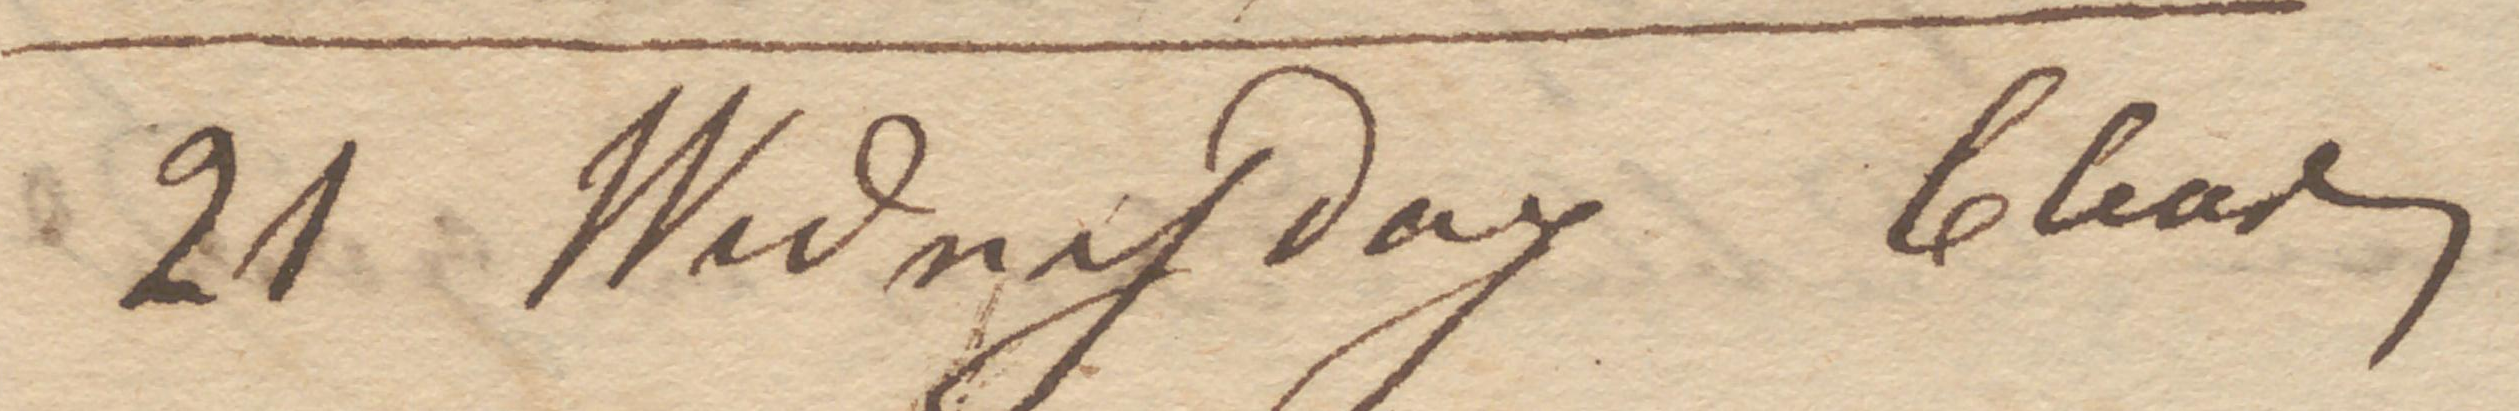21 Wednesday Clear
